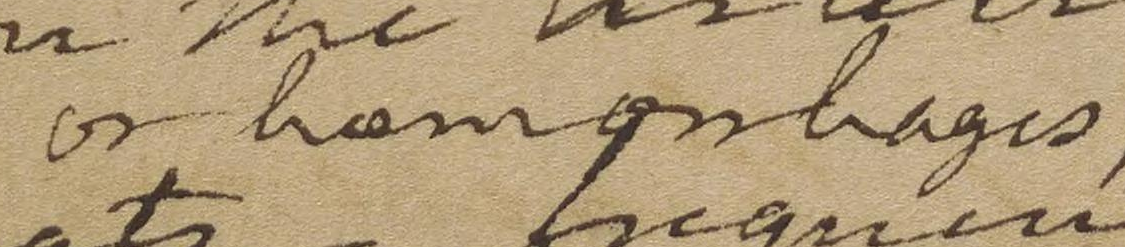or hemorhages
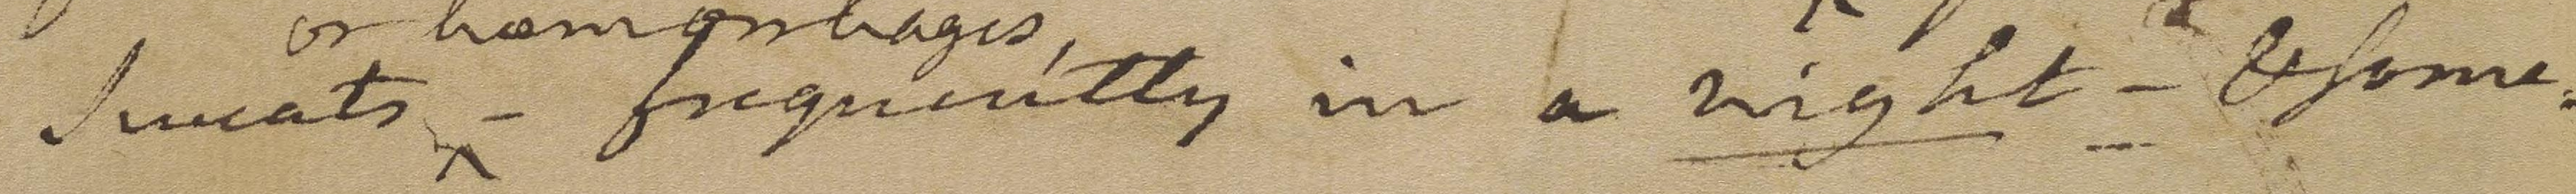sweats ^ frequently in a night, & some-
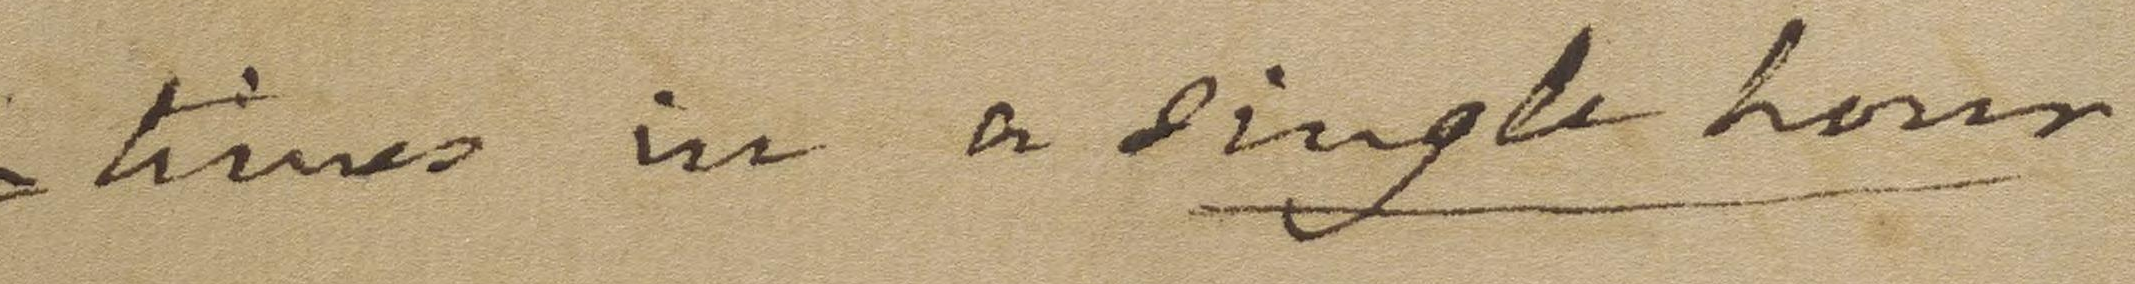-times in a single hour
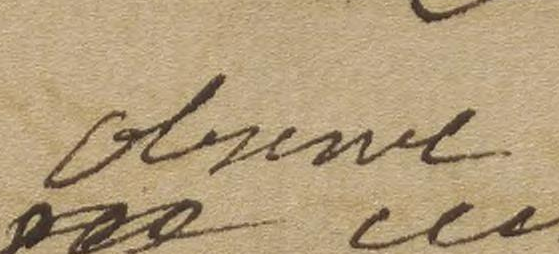observe
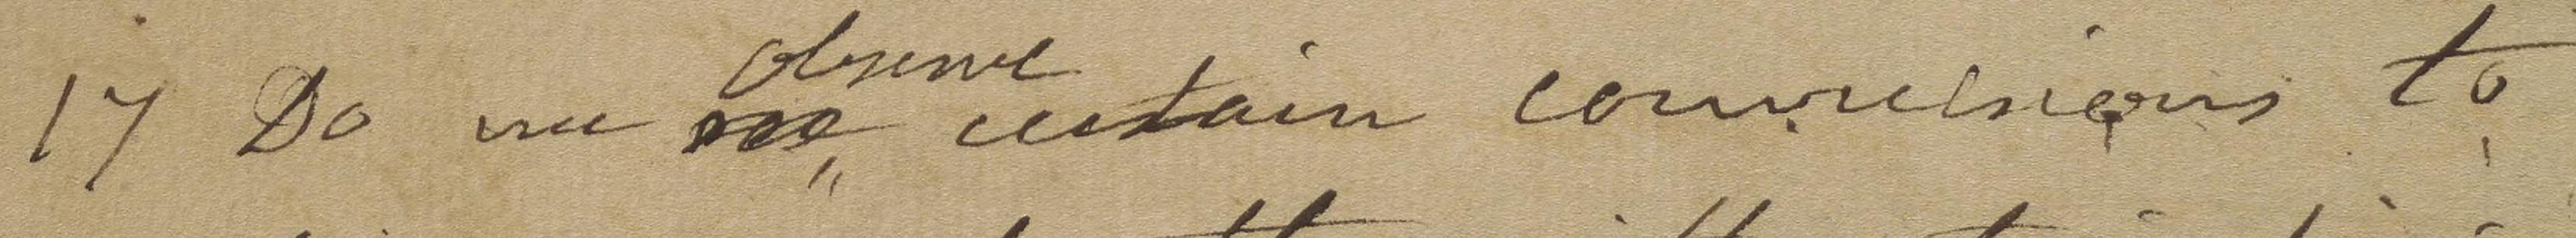17 Do we [see] ^ certain convulsions to
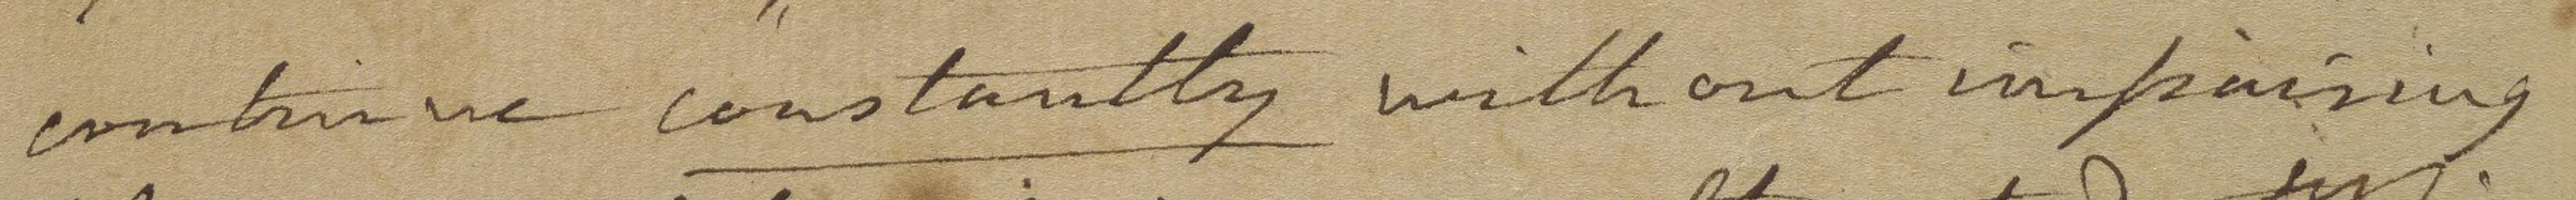contrive constantly without impairing
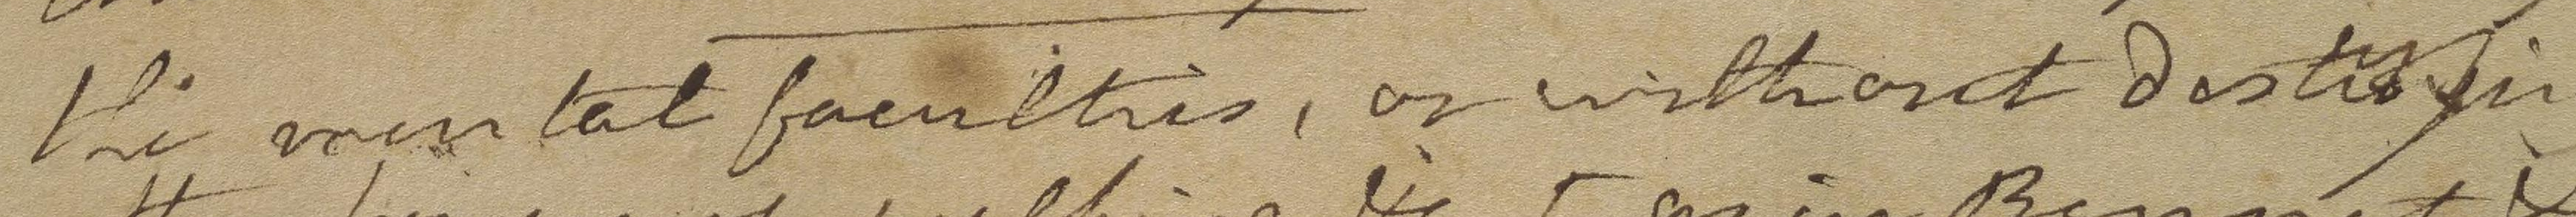the mental faculties, or without destroying
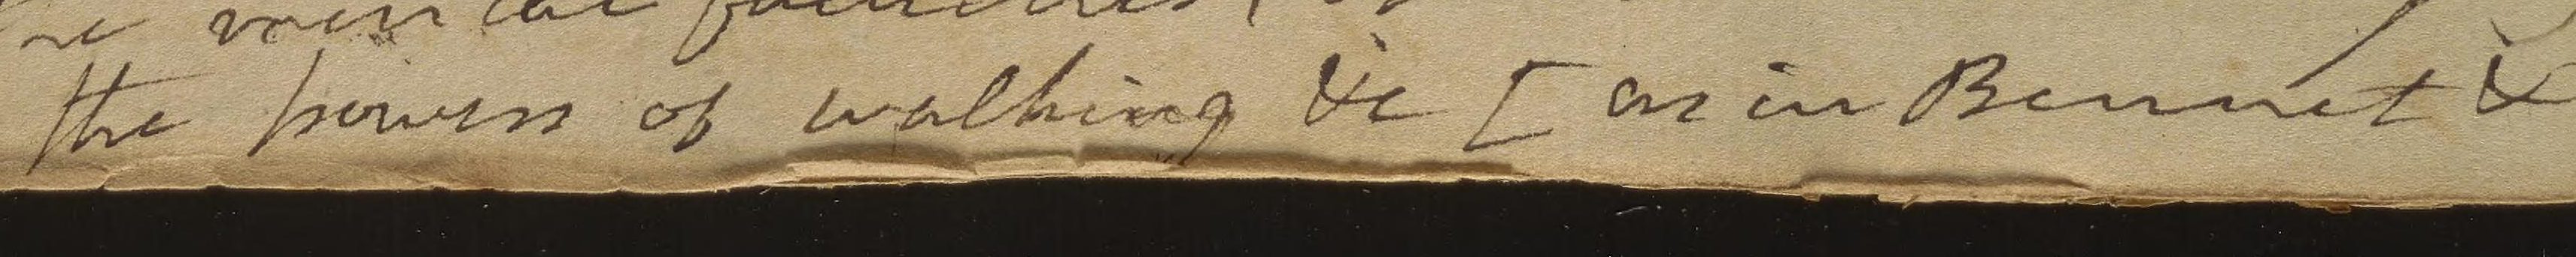powers of walking &c (as in Bennet &c
